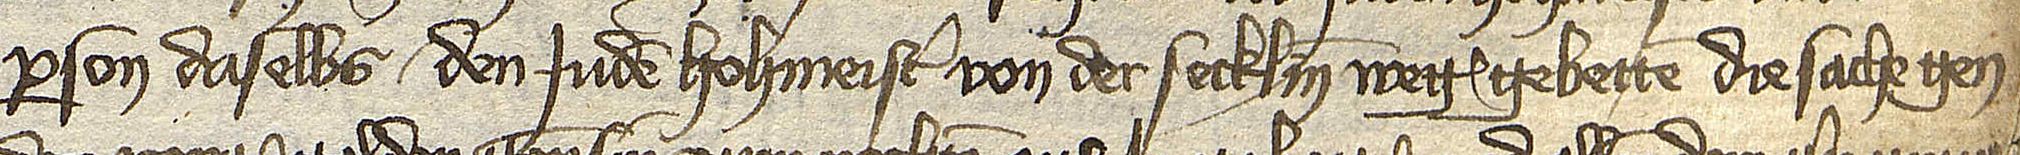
p*ſon daſelbs / den Iude* hohmeiſt* von der ſecklin* weg* gebette* die ſache gen
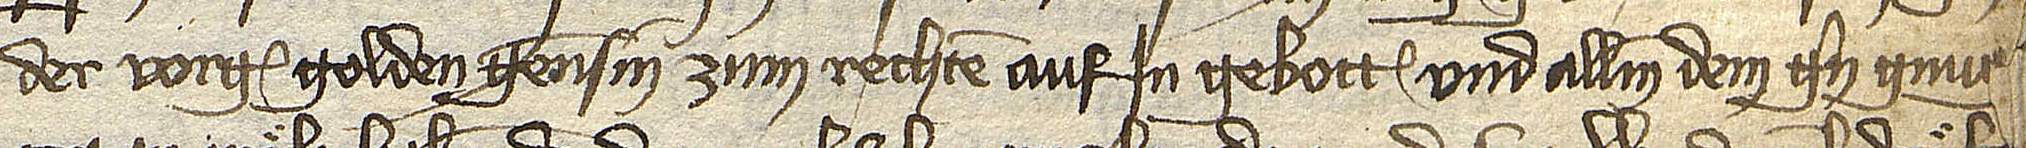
der vorg* golden genſin ʒum rechte* auf In gebott* vnd allm* dem g*n gnug
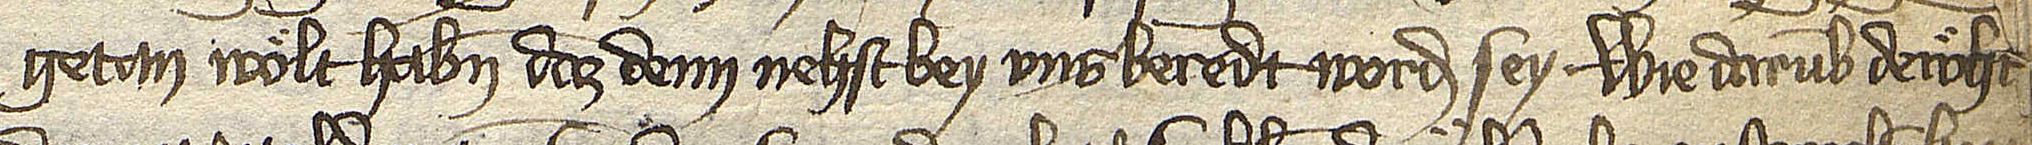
getan wölt habn* daʒ denn nehſt bey vns beredt word* ſey Wie darub* dewht
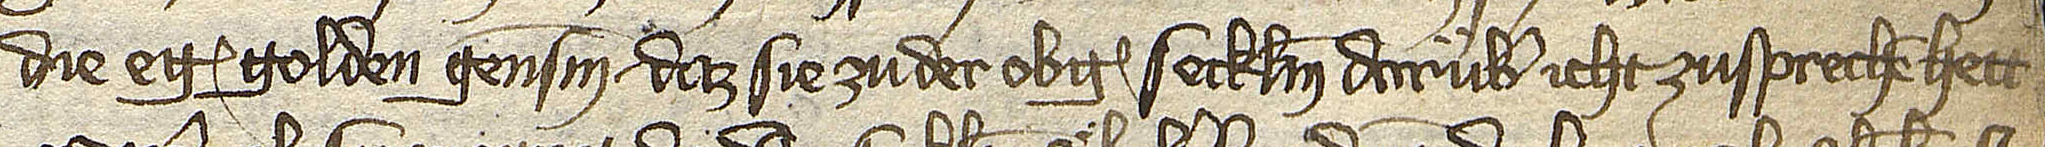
die eg* golden genſin / daʒ ſie ʒu der obg* ſecklin* darüb* icht ʒuſpreche* hett
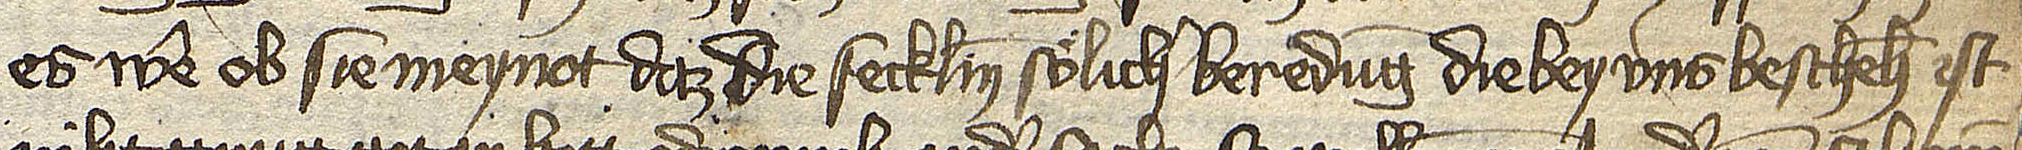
es w*e ob ſie meynot daʒ die ſecklin* ſölilch* beredug* die bey vns beſcheh* iſt
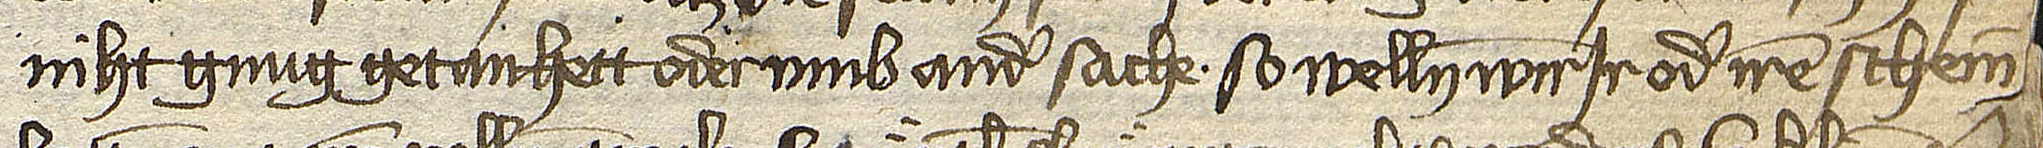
niht gnug getan hett oder vmb and* ſache . ſo welln* wir Ir od* ire* ſchein
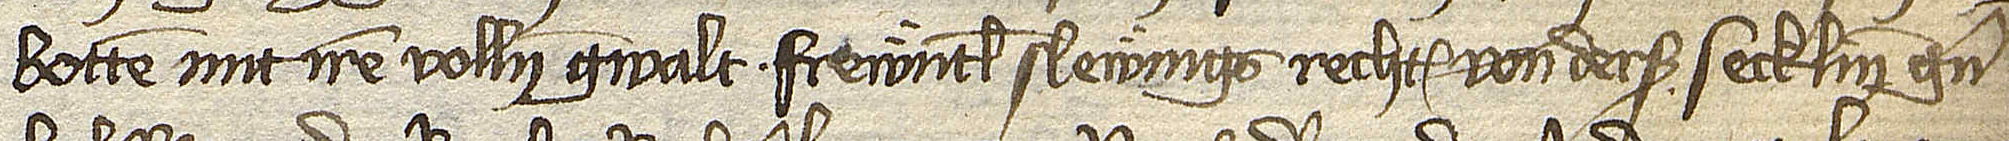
botte* mit ire* volln* gwalt . frewntl* ſlewnigs recht* von derſ* ſecklin* gn*
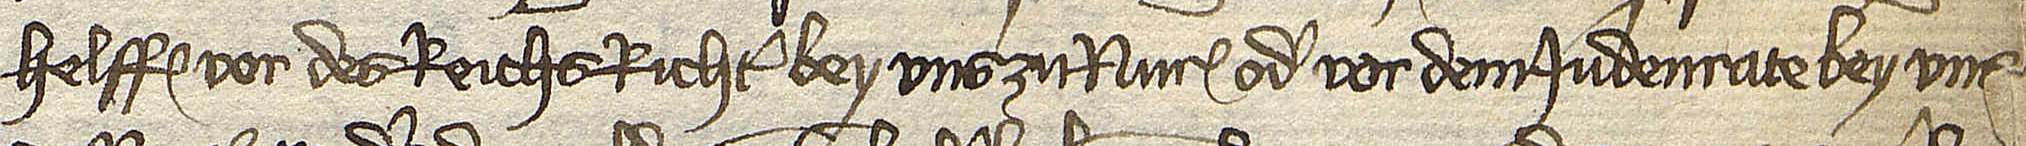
helff* vor des Reichs Richt* bey vns ʒu Nur* od* vor dem Iudenrate bey vns
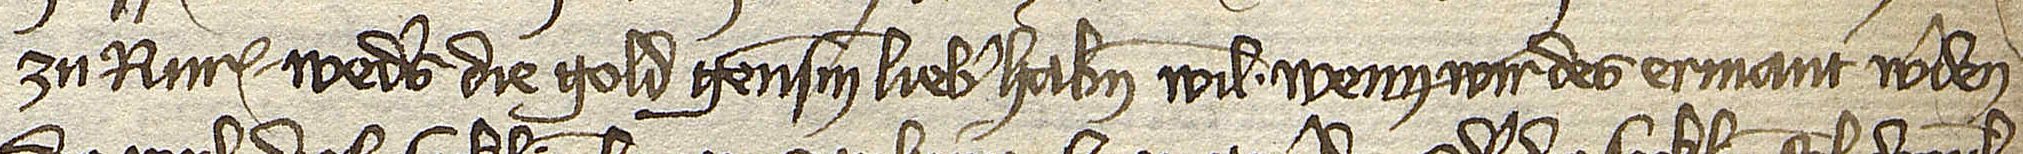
ʒu Nur* wed*s die gold genſin lieb* habn* wil . wenn wir des ermant w*den
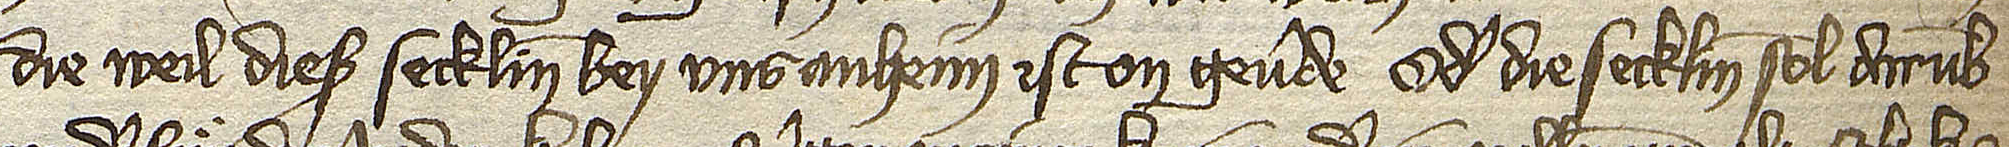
die weil dieſ* ſecklin* bey vns anheim iſt on geu*de Od* die ſecklin* ſol darub*
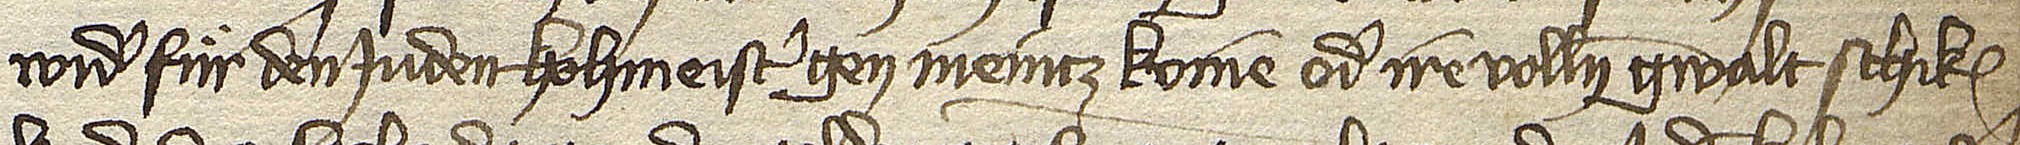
wid* für den Iuden hohmeiſt* gen meincʒ kome* od* ire* volln* gwalt ſchik*
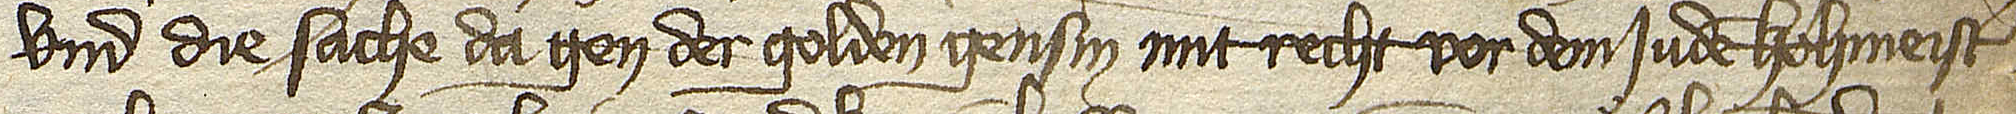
vnd die ſache da gen der golden genſin* mit recht vor dem Iude* hohmeiſt*
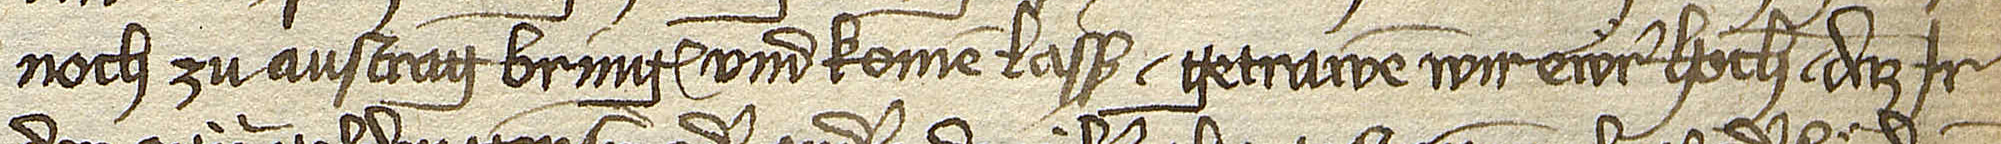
noch ʒu auſtrag bring* vnd kome* laſſ* / getrawe* wir ewr* hoch* / daʒ Ir
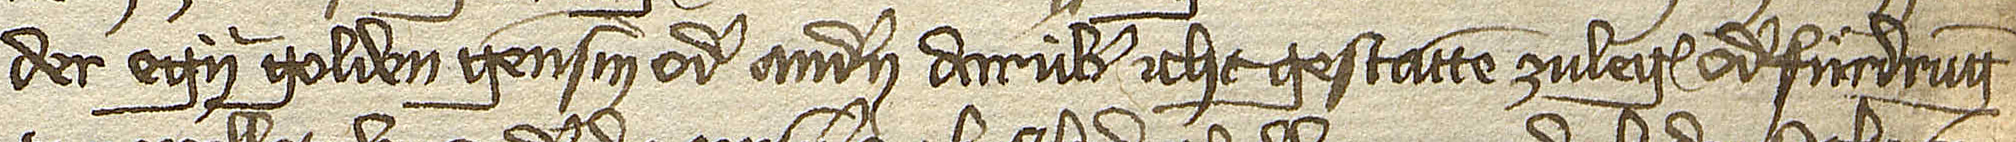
der egn* golden genſin od* and*n darüb* icht geſtatte* ʒuleg* od* fürdrug*
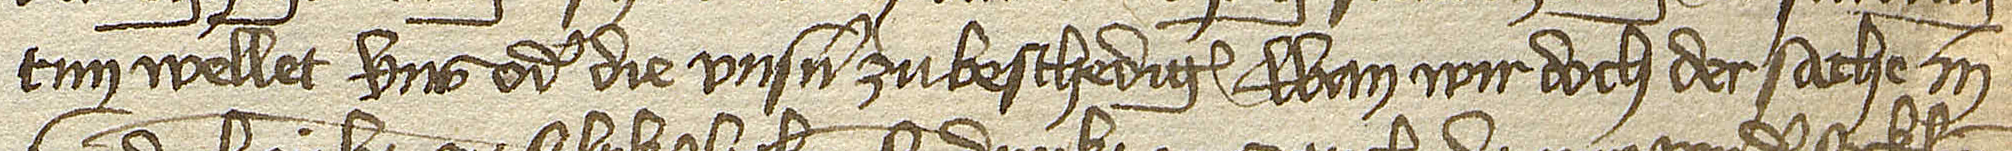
tun wellet Vns od* die vnſn* ʒu beſchedig* / wan wir doch der ſache in
